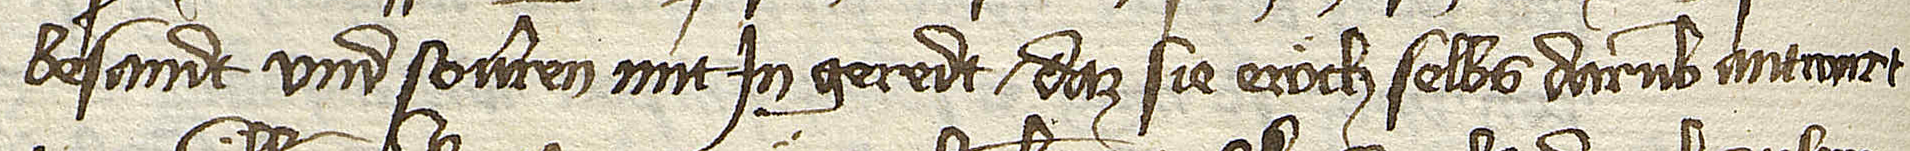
beſandt vnd ſou*ren mit In geredt / daʒ ſie eẅch ſelbs darub* antwurt
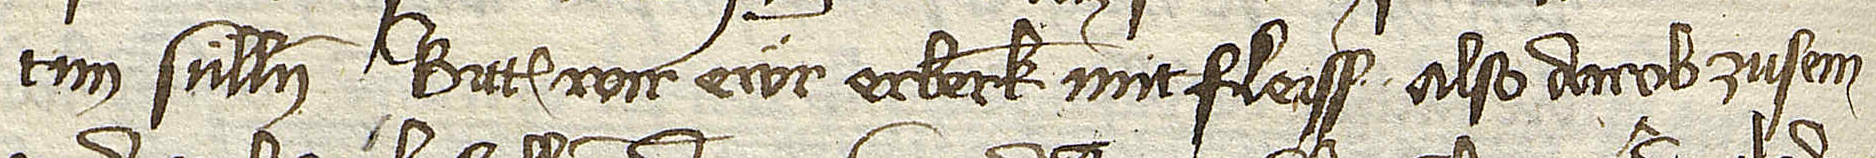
tun ſülln* Bitt* wir eẅr erberk* mit fleiſſ / alſo darob ʒuſein
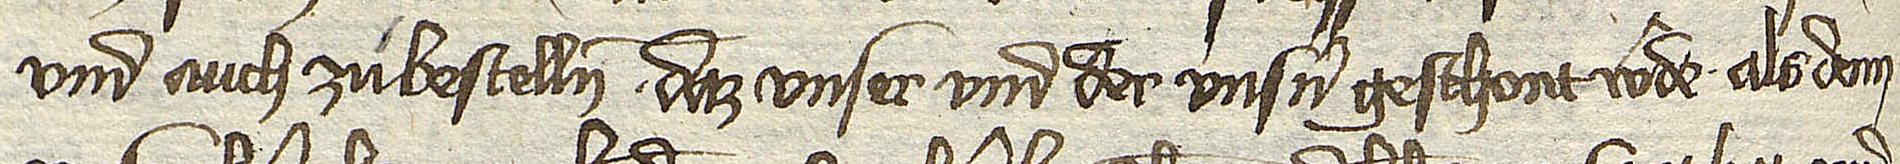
vnd auch ʒubeſtelln* / Daʒ vnſer vnd der vnſn* geſchont w*de . als denn
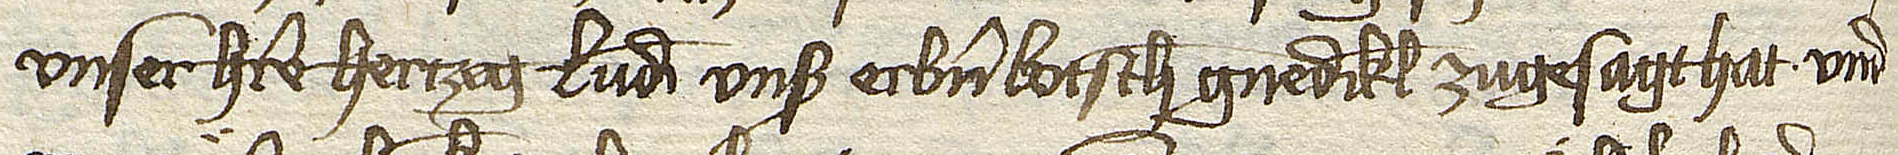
vnſer h*re hercʒog Lud* vnſ* erbn* botſch* gnedikl* ʒugeſagt hat . vnd
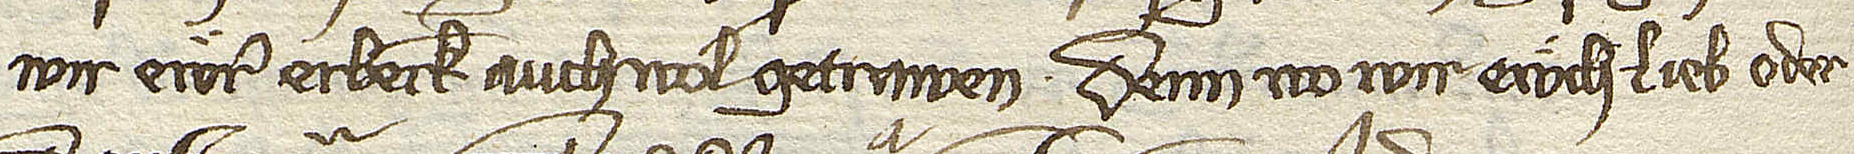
wir eẅr* erberk* auch wol getrawen . Denn wo wir eẅch lieb oder
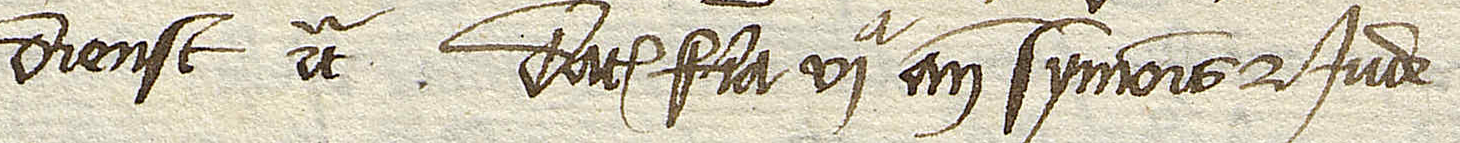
dienſt ec* Dat* fi*a vi* an* ſymo*is @ Iude
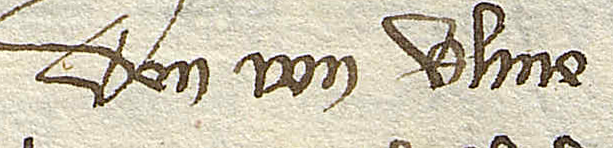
Den von Vlme
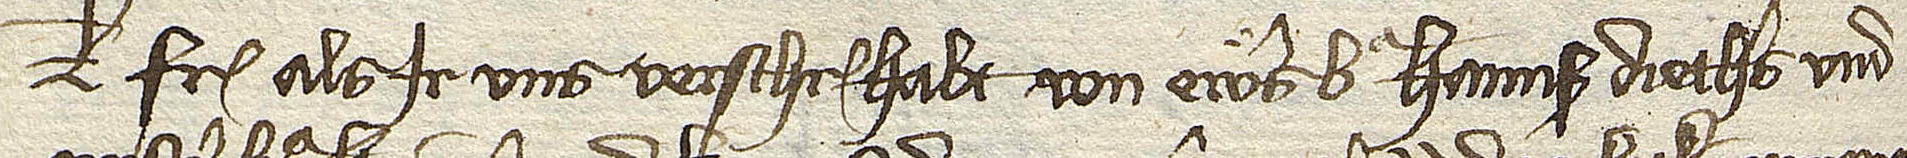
L* fr* als Ir vns verſchr* habt von eẅ*s b* hannſ* dieth*s vnd
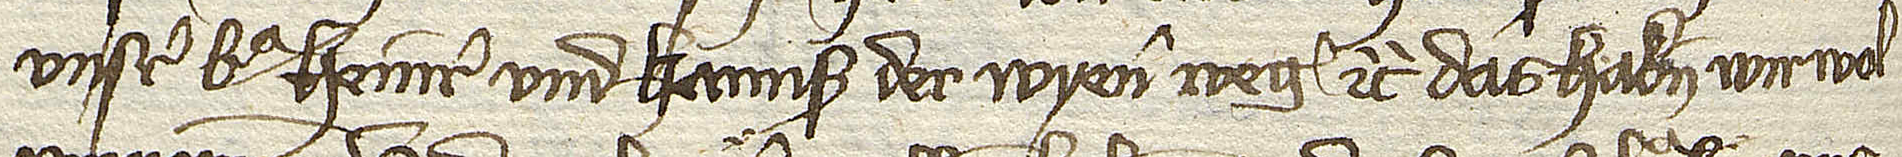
vnſr* b* heinr* vnd hannſ* der wyen* weg* ec* das habn* wir wol
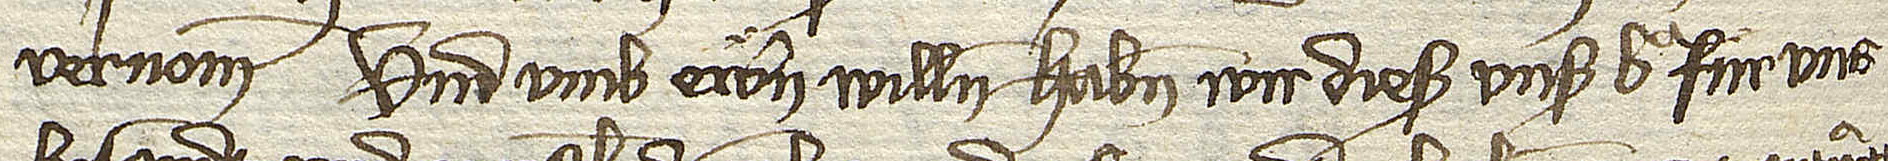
vernom* Vnd vmb eẅ*n willn* habn* wir dieſ* vnſ* b* für vns
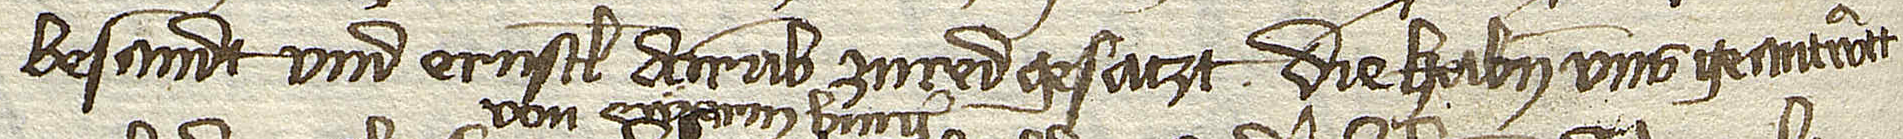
beſandt vnd ernſtl* darub* ʒured geſacʒt . Die habn* vns geantw*tt
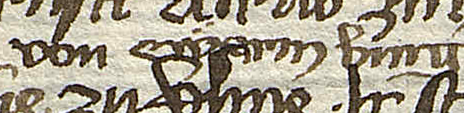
von eẅerm burg*
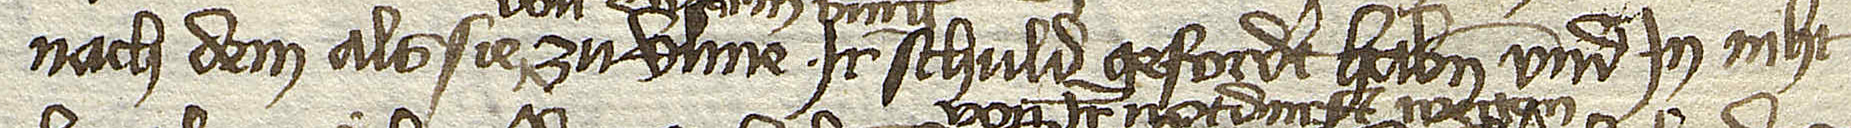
nach dem als ſie ʒu Vlme Ir ſchuld geford*t habn* vnd In niht
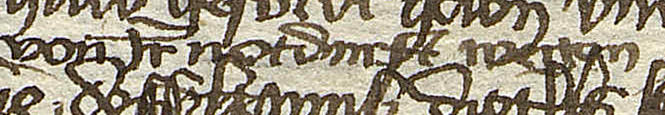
von Ir notdurft wegen
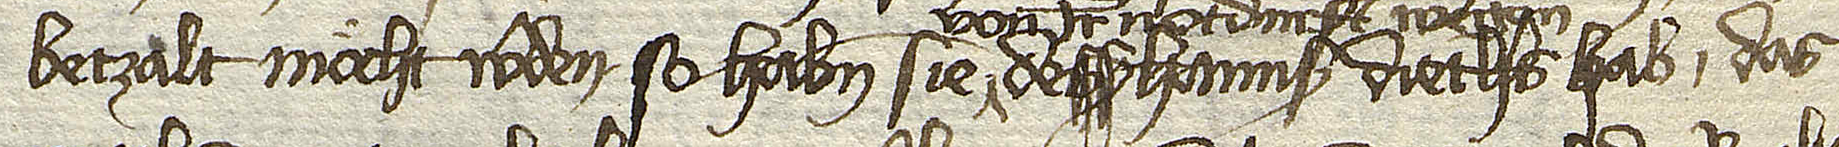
betʒalt möcht w*den / ſo habn* ſie deſſ* hannſ* dieth*s hab / das
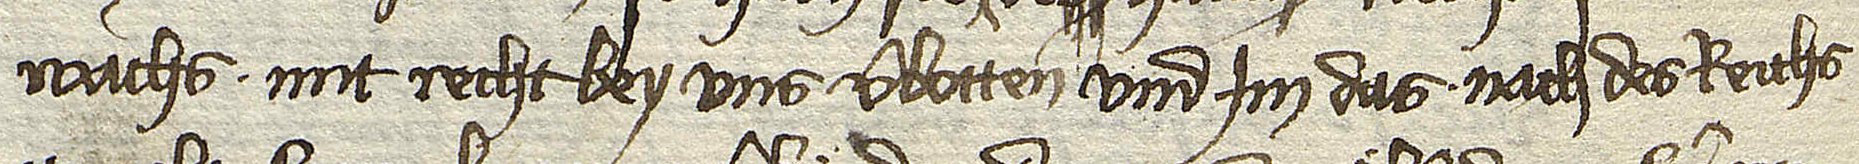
wachs . mit recht bey vns v*botten vnd Im das . nach des Reichs
